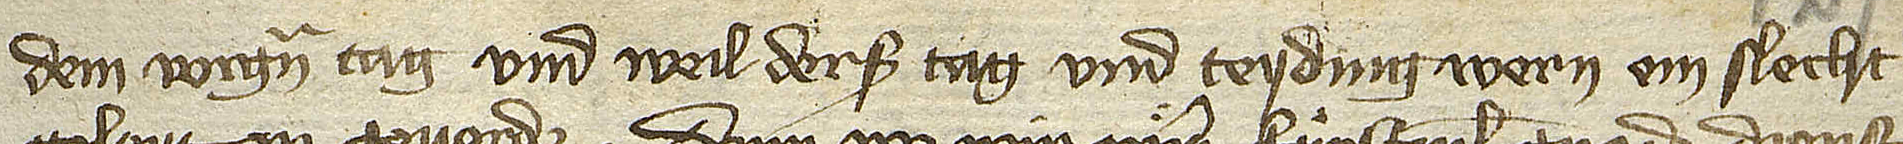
dem vorgn* tag vnd weil derſ* tag vnd teyding wern ein ſleht
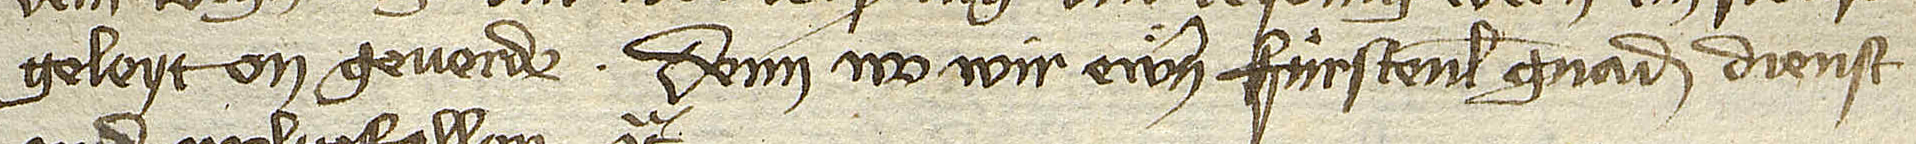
geleyt on geuerde . Denn wo wir eẅn* fürſtenl* gnad* dienſt
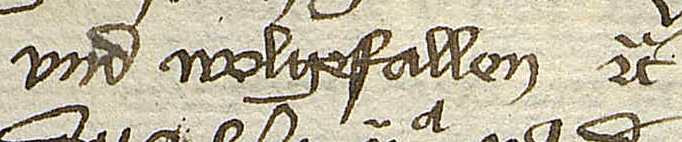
vnd wolgefallen ec*
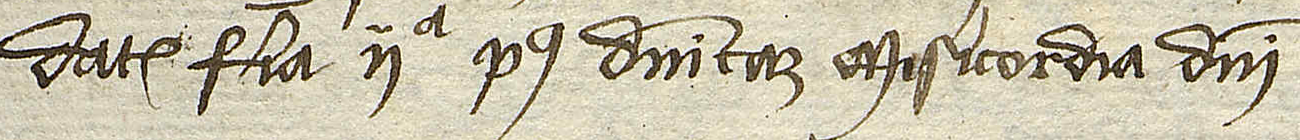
Dat* fia* ii* p* dinca* Miſ*icordia dni*
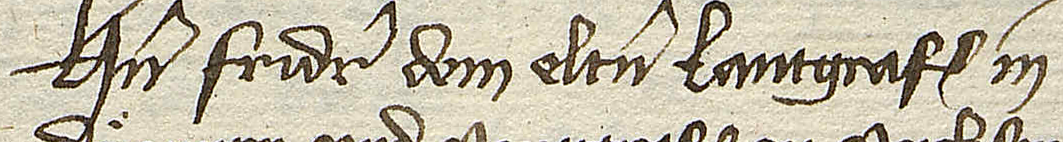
Hn* fridr* dem eltn* lantgraf* in
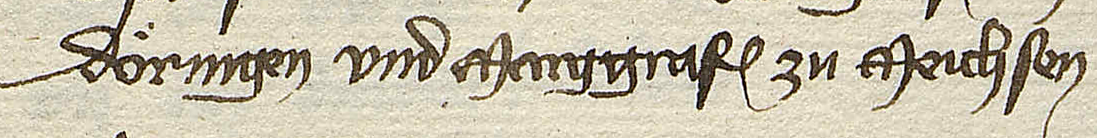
döringen vnd Marggraf* ʒu Meichſen
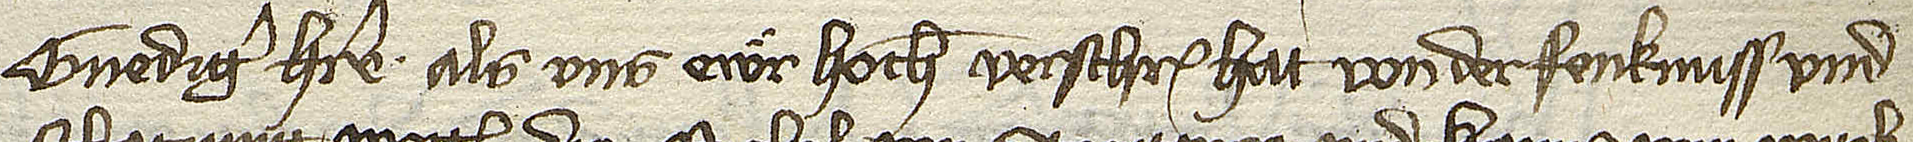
Gnedig* hr*e als vns eẅr hoch* verſchr* hat von der fenknuſſ vnd
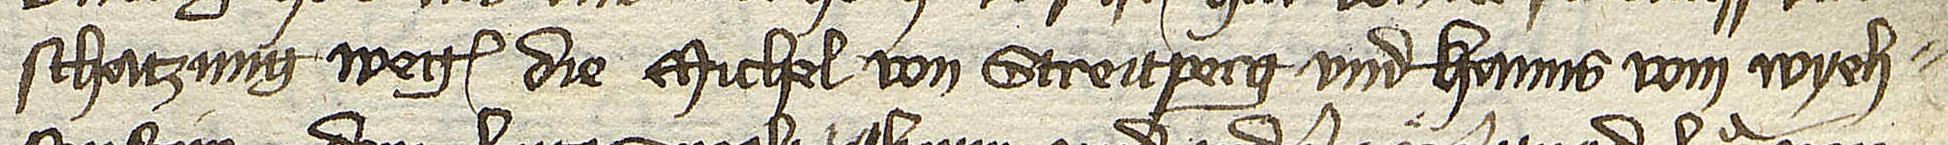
ſchacʒung weg* die Michel von Streitperg vnd Hanns vom wyeh =
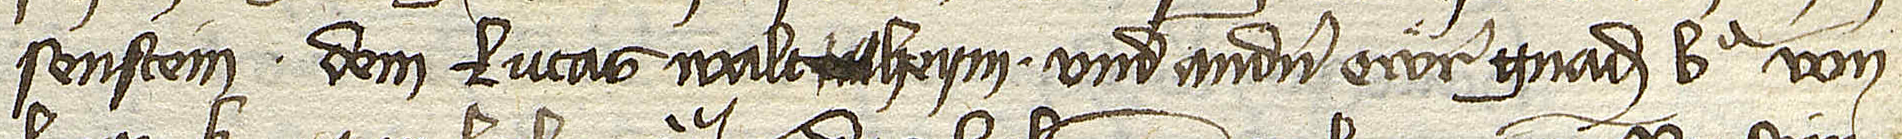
ſenſtein dem Lucas walt%%heym . vnd andn* eẅr* gnad* b* von
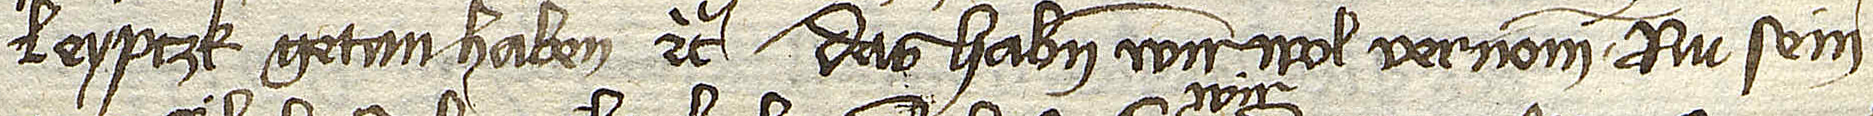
leypcʒk getan haben ec* / das habn* wir wol vernom* / Nu ſein
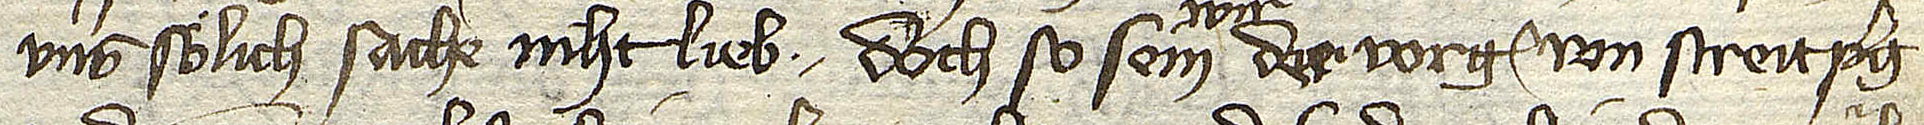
vns ſölich ſache niht lieb / Doch ſo ſein der vorg* von ſtreitpg*
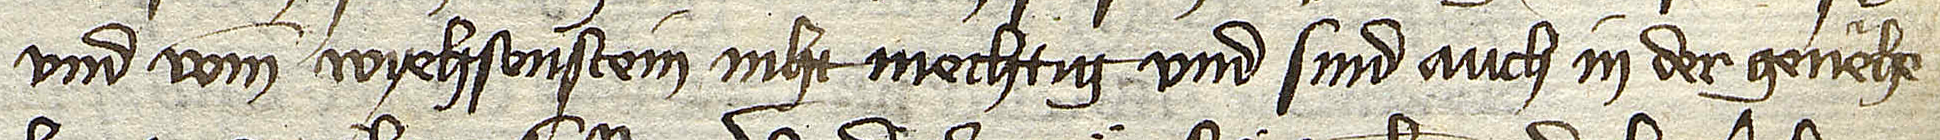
vnd vom* wyehſenſtein niht mechtig vnd ſind auch in der genëhe
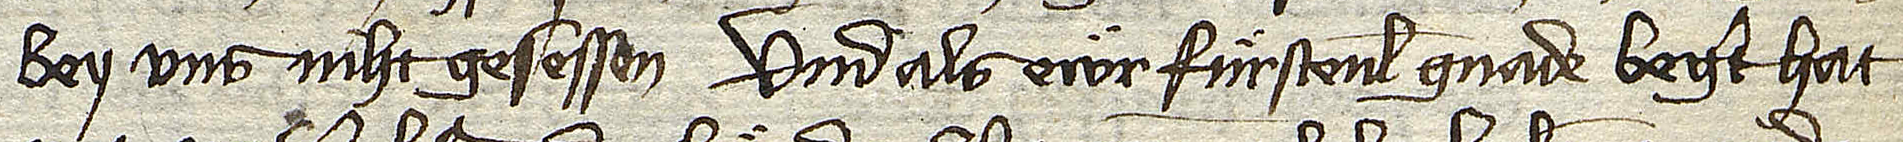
bey vns niht geſeſſen Vnd als eẅr fürſtenl* gnade begt* hat
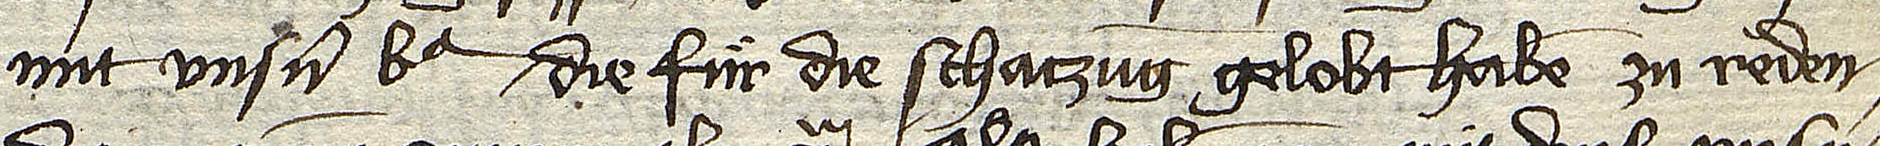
mit vnſn* b* / die für die ſchacʒug* gelobt habe* ʒu reden
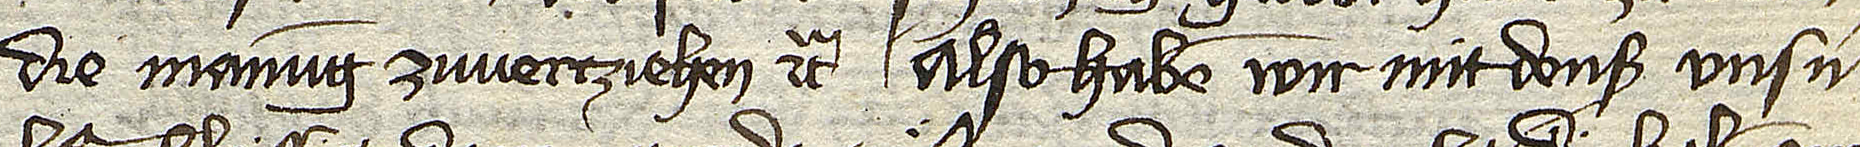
die manug* ʒuuercʒiehen ec* Alſo habe* wir mit denſ* vnſn*
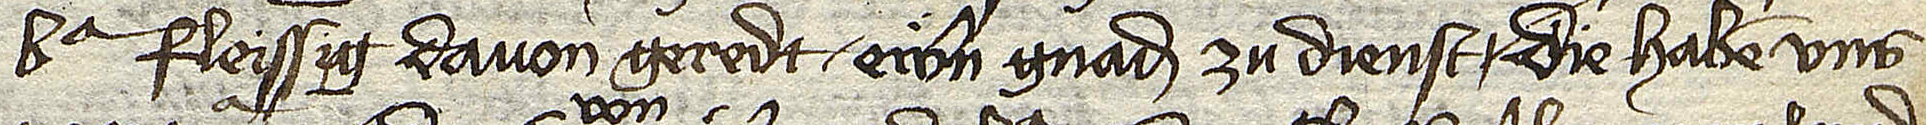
b* fleiſſig dauon geredt / eẅn* gnad* ʒu dienſt / Die habe* vns
